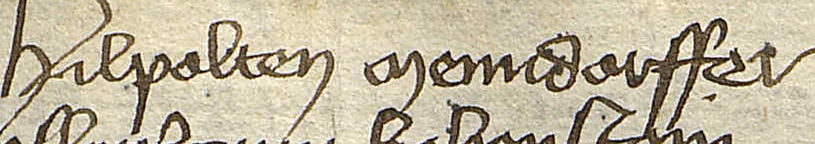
Hilpolten Menndorffer
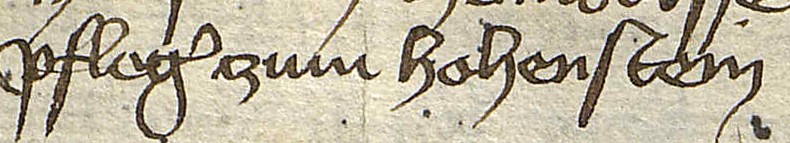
pfleg* cʒum hohenſtein
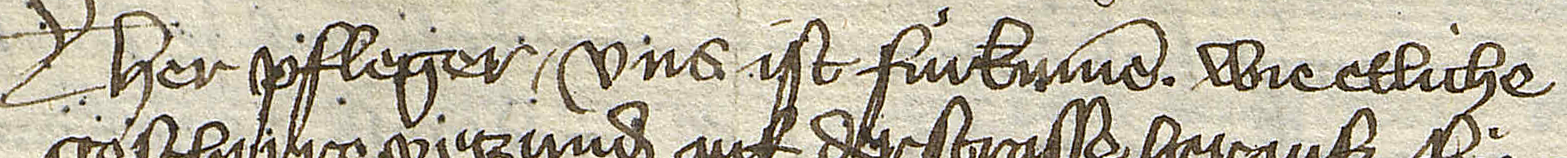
L* her pfleger / vns iſt fürkume* . wie etliche
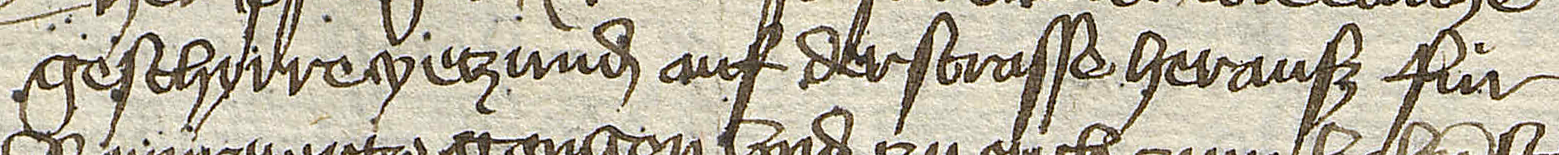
geſchyrre yecʒund* auf der ſtraſſe herauſʒ für
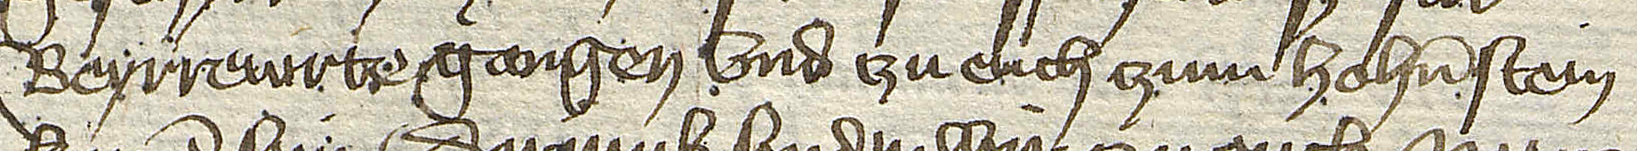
Beyrrewrte gangen vnd cʒu euch cʒum hohn*ſtein
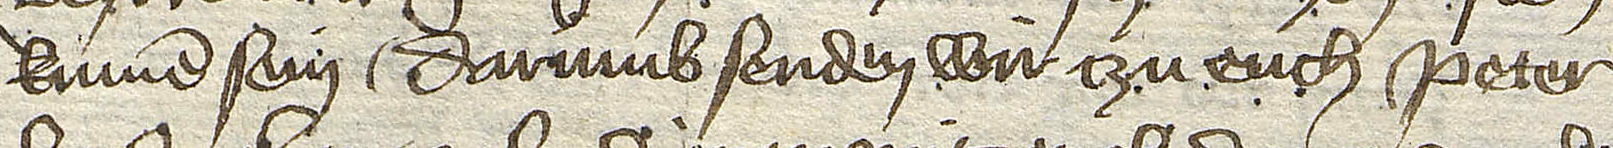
kume* ſein / Darümb ſenden wir cʒu euch Peter
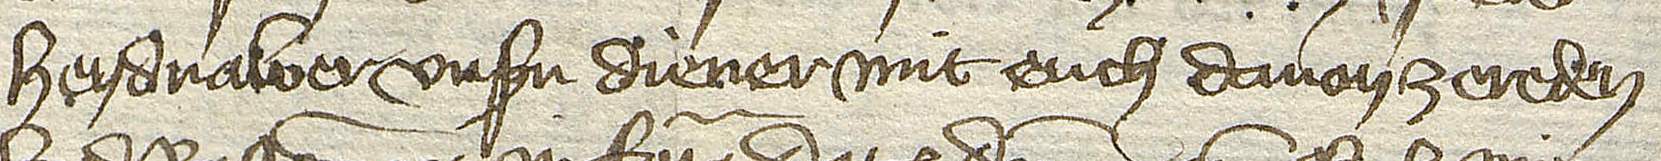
heydnaber vnſ*n diener mit euch dauon cʒereden
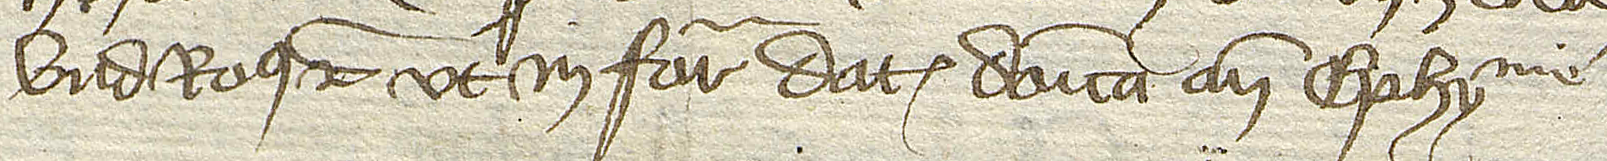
vnd Ro* ec* vt in for* Dat* Doica* an* Ephy*
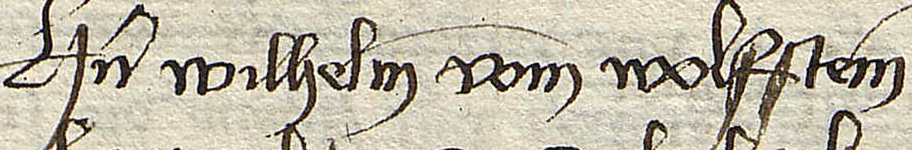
Hn* wilhelm* vom wolfſtein
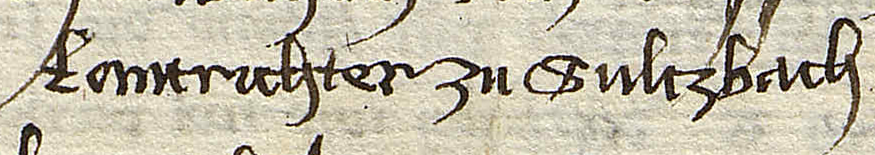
lantrichter ʒu Sulcʒbach
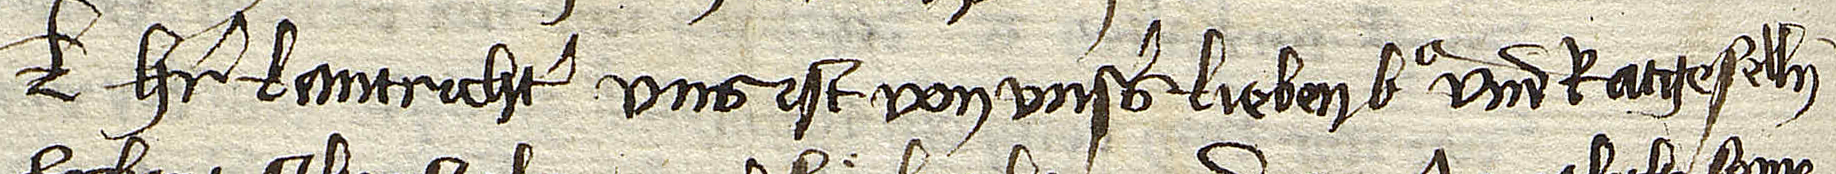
L* Hr* lantricht* vns iſt von vnſ*s lieber b* vnd Ratgeſelln*
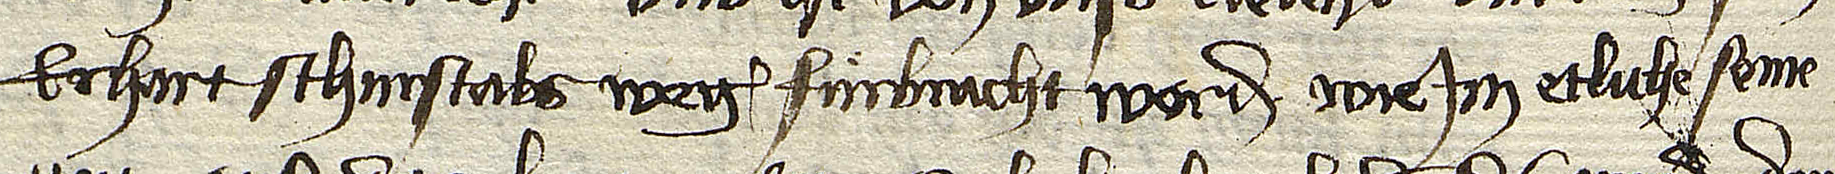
Erhart ſchurſtabs weg* fürbracht word* wir Im etliche ſeine
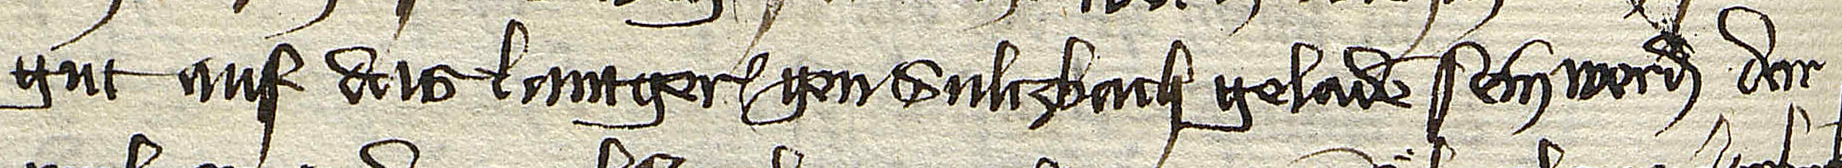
gut auf das lantger* gen Sulcʒbach gelade* ſein word* dar
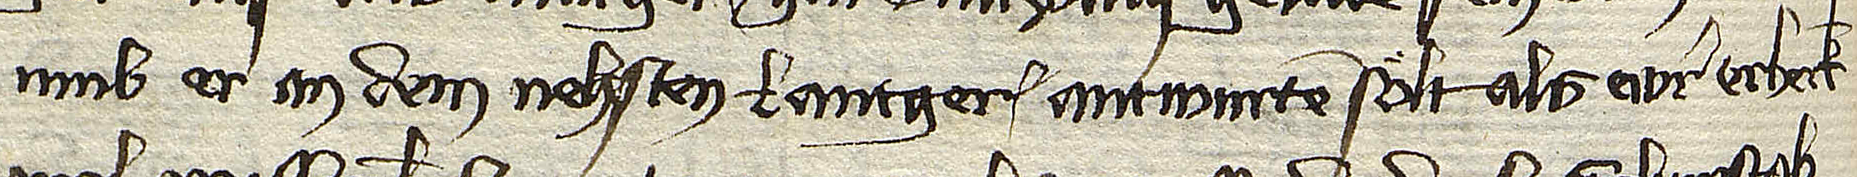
umb er an dem nehſten lantger* antwurte* ſölt als ewr* erberk*
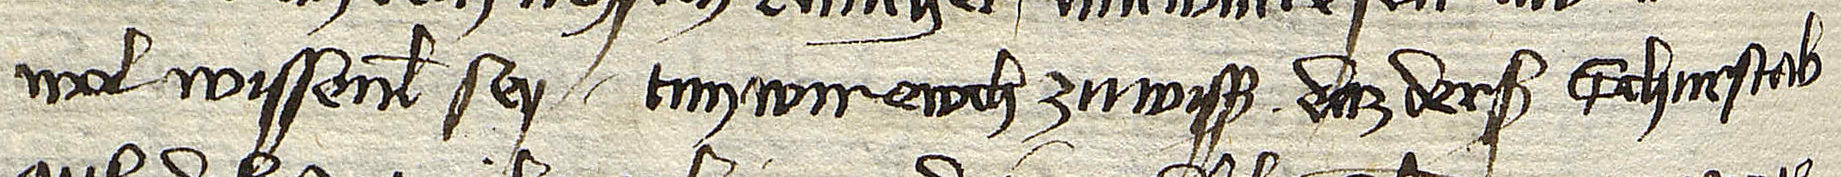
wol wiſſenl* ſey / tun wir ewch ʒu wiſſ* . daʒ derſ* Schurſtab
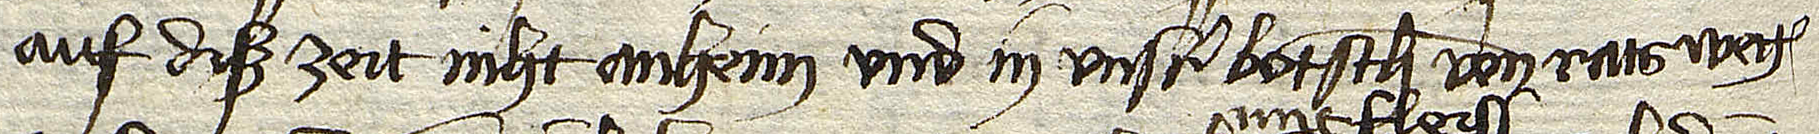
auf diſʒ ʒeit niht anheim vnd in vnſr* botſch* von rats weg*
